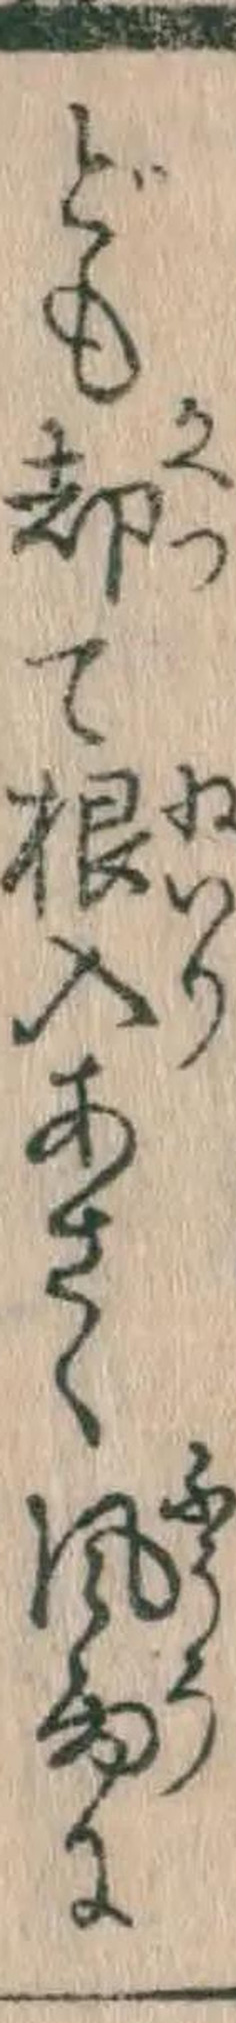ども却て根入あさく風雨に
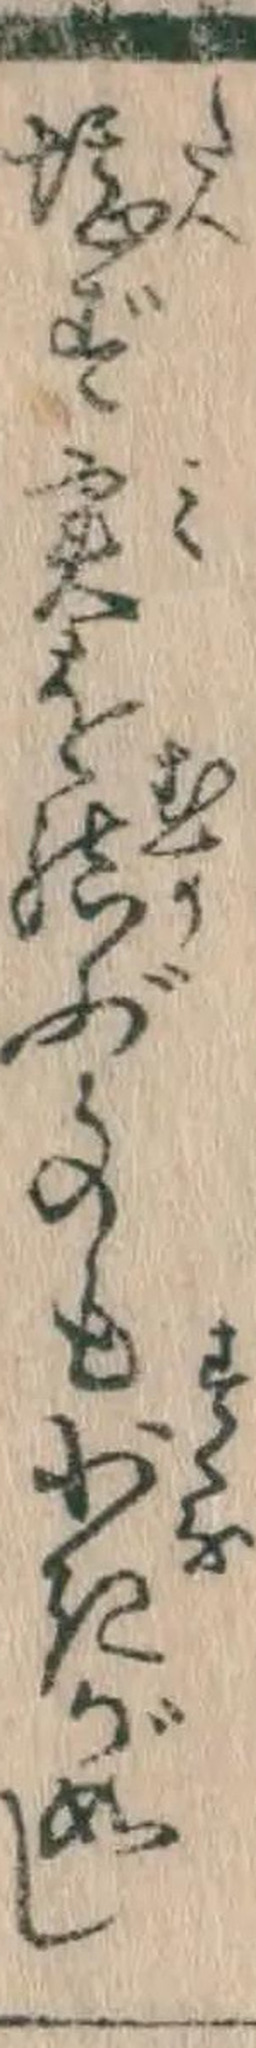堪ず実を結ぶ事も少きが如し
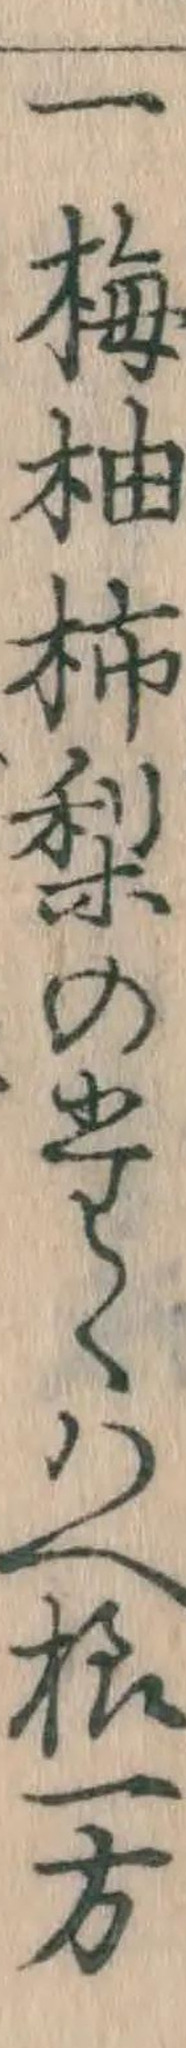一梅柚柿梨のたくはへ様一方
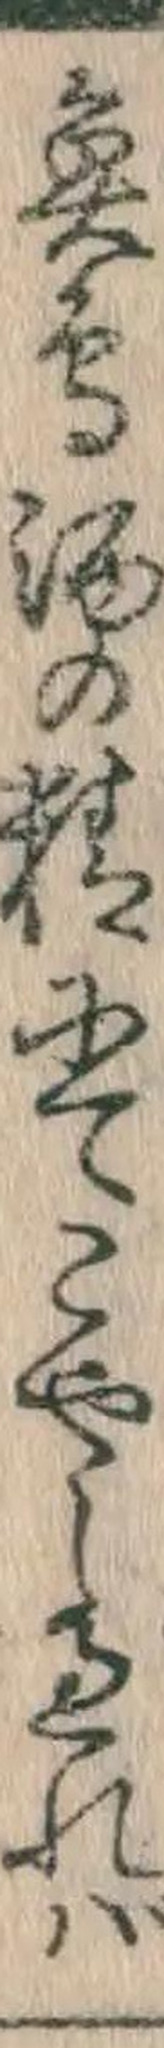魚鳥酒の精にてこやし過れば
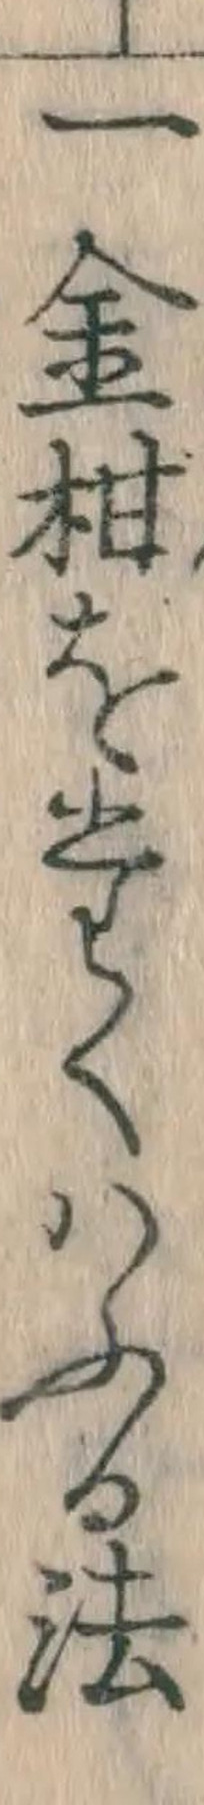一金柑をたくはふる法
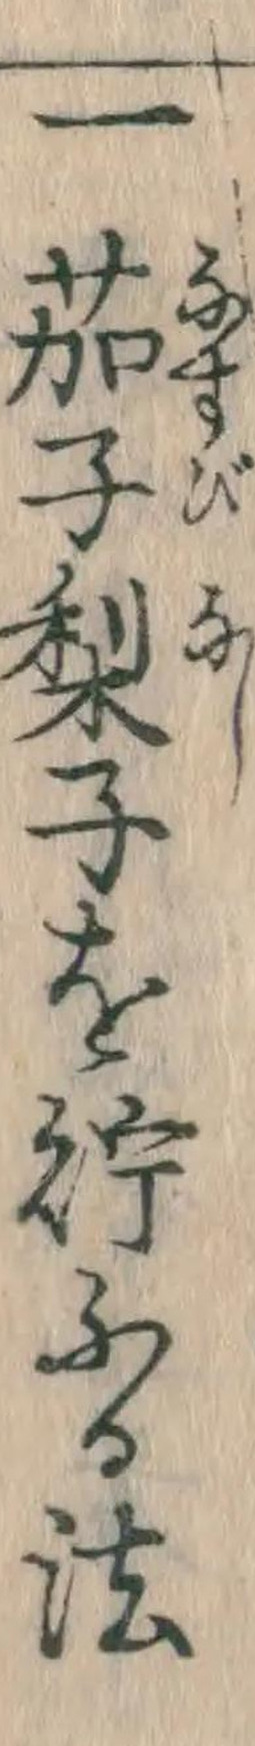一茄子梨子を貯ふる法
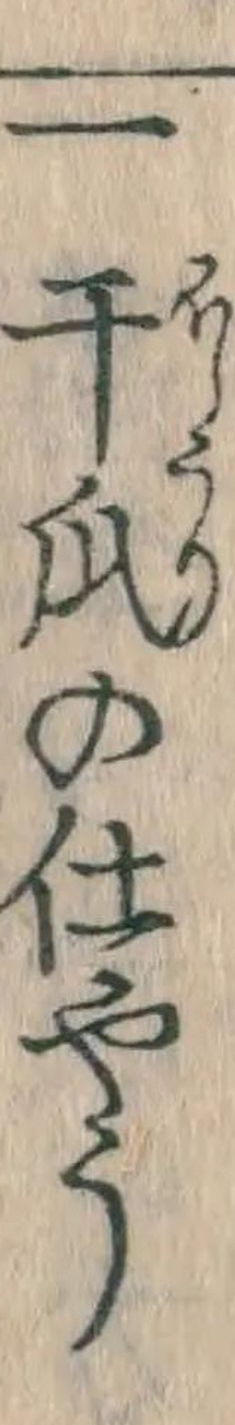一干瓜の仕やう
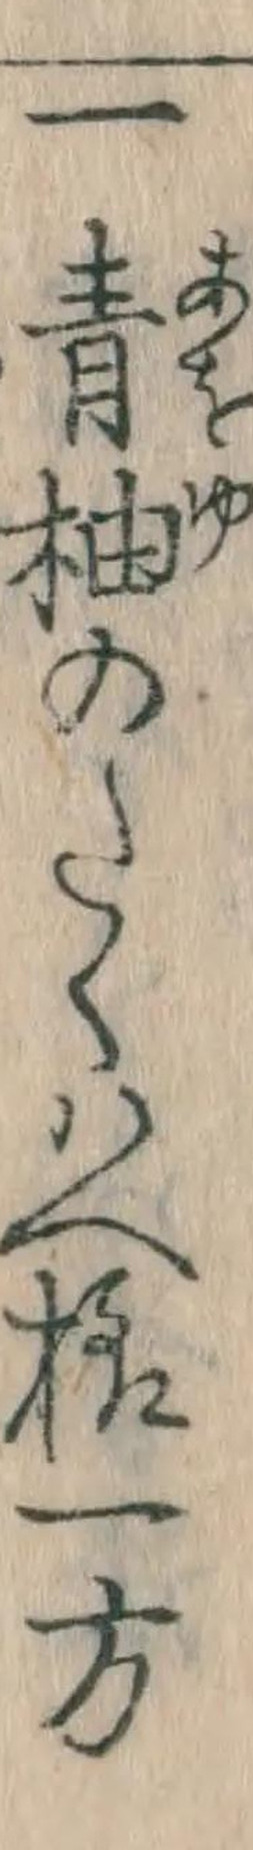一青柚のたくはへ様一方
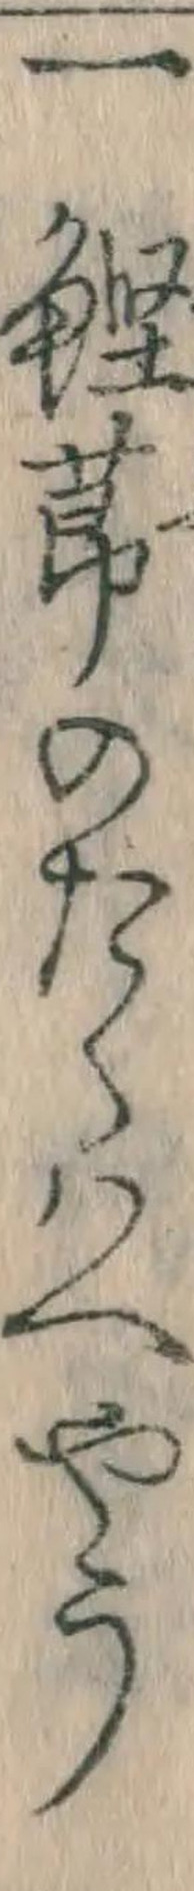一瓜のたくはへやう
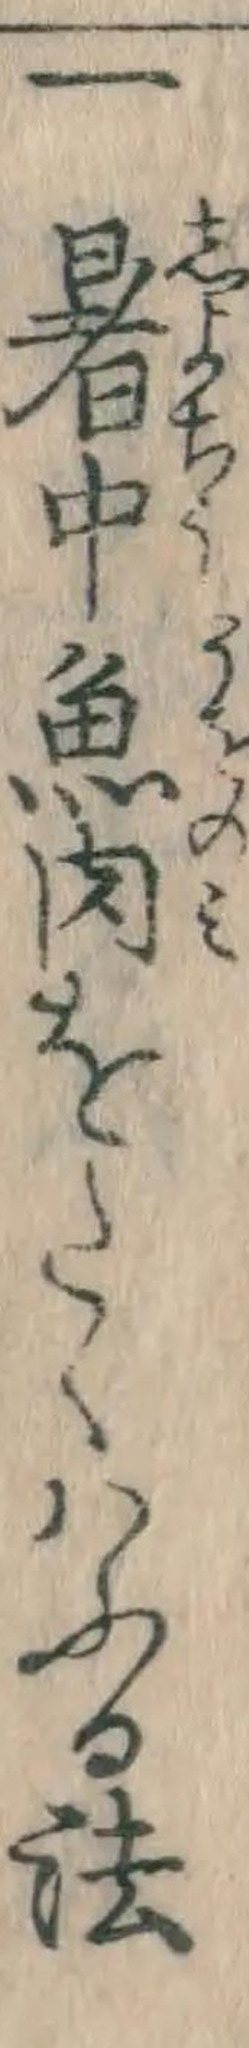一暑中魚肉をたくはふる法
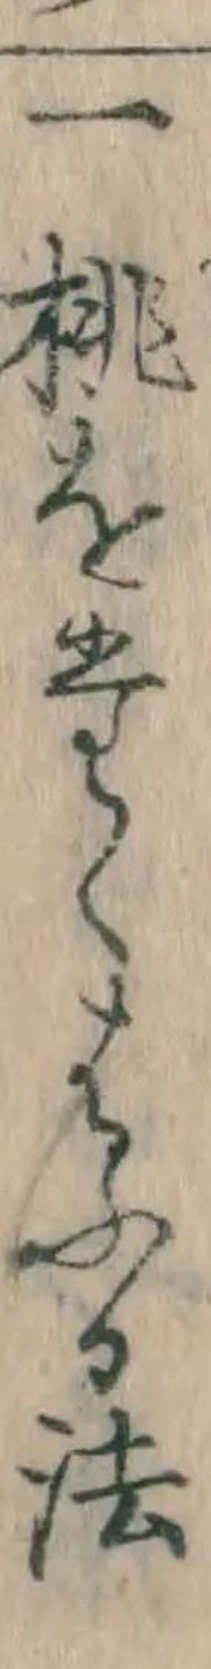一桃をたくはふる法
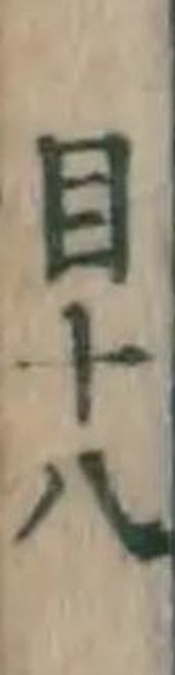目十八

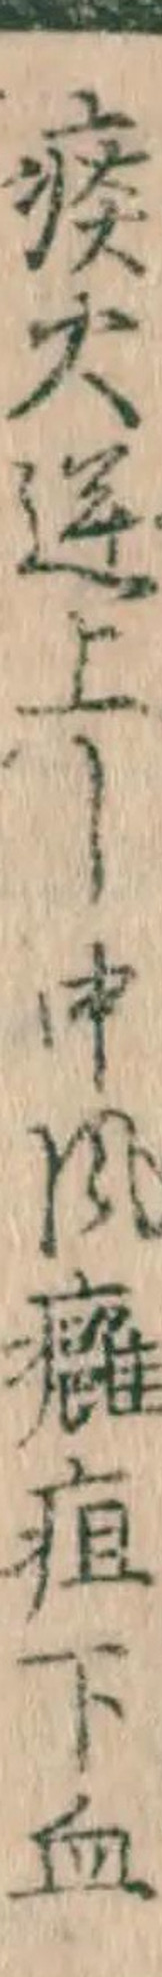痰火逆上し中風癰疽下血
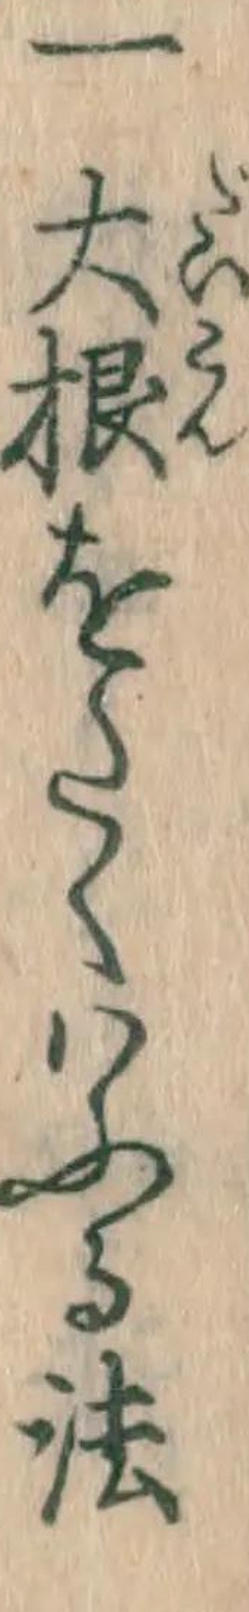一大根をたくはふる法
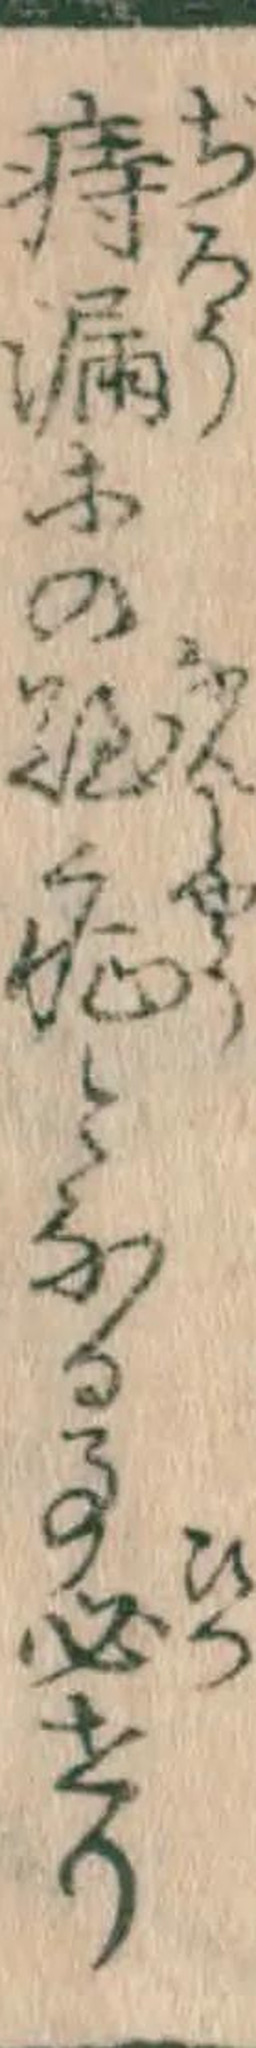痔漏等の難症となる事必せり
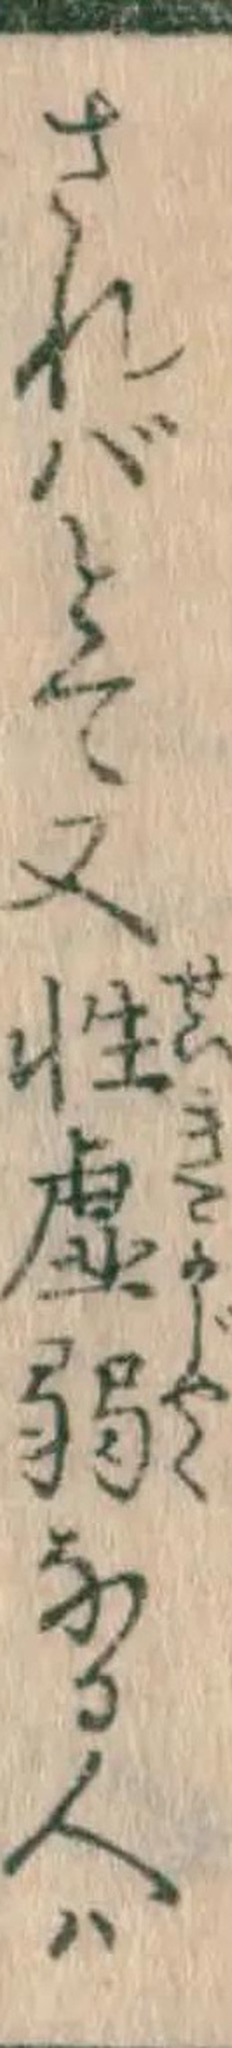さればとて又性虚弱なる人は
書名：広益秘事大全 3巻. [1]
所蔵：国立国会図書館 National Diet Library, JAPAN
